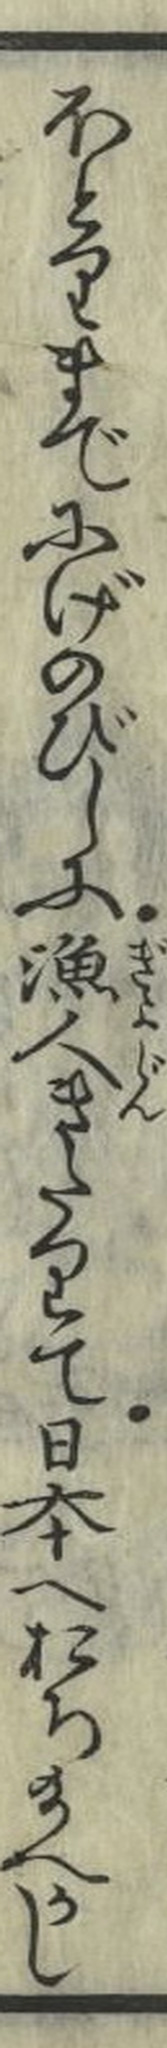ほとりまでにげのびしに・漁人きたりて・日本へおち給へかし
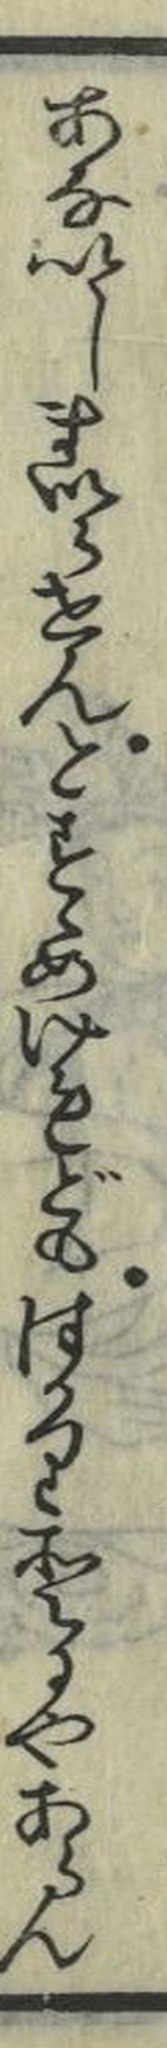あないしまいらせん・とすゝめけれども・はかりことにやあらん
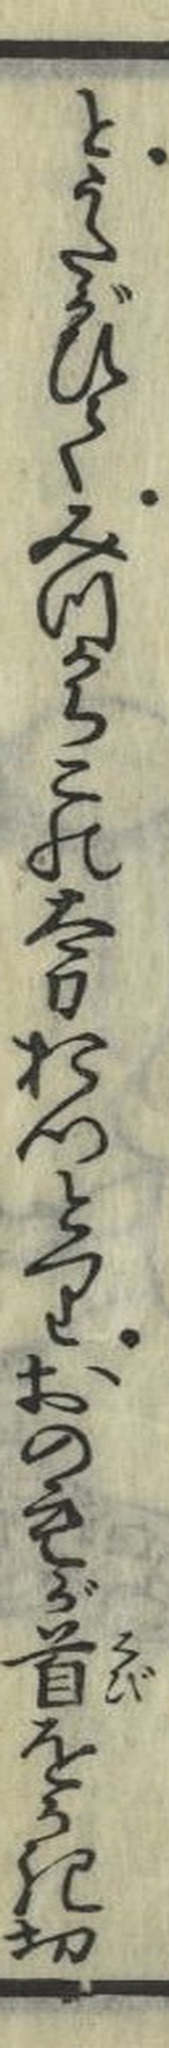と・うたがひて・みつからこの太刀おつとり・おのれが首をかき切
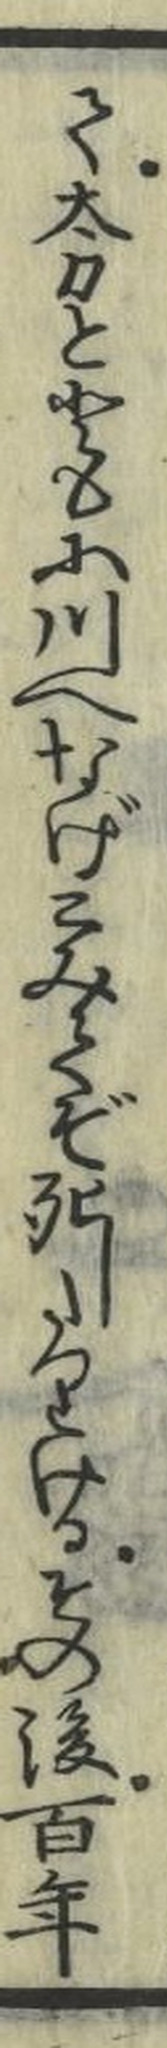て・太刀とともに川ヘなげこみてぞ死したりける・その後・百年
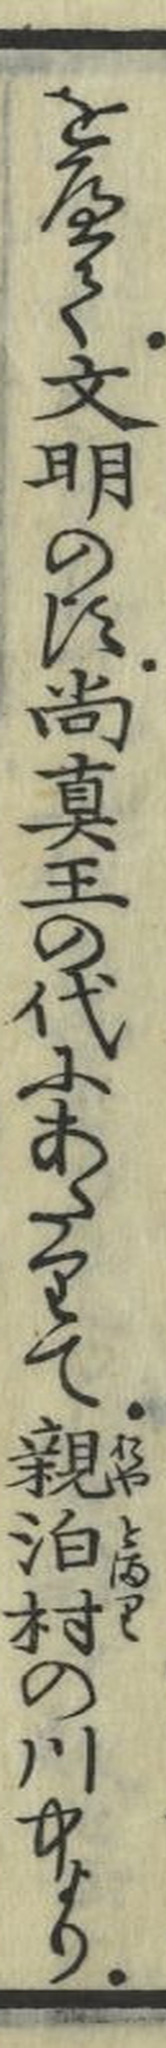をへて・文明の頃・尚真王の代にあたりて・親泊村の川中より・
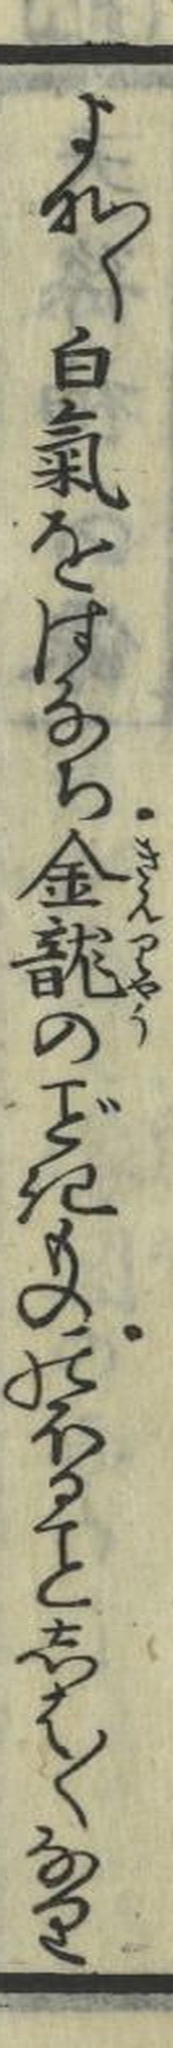よな〳〵白氣をはなち・金龍のごときもの・のほることしは〳〵なり
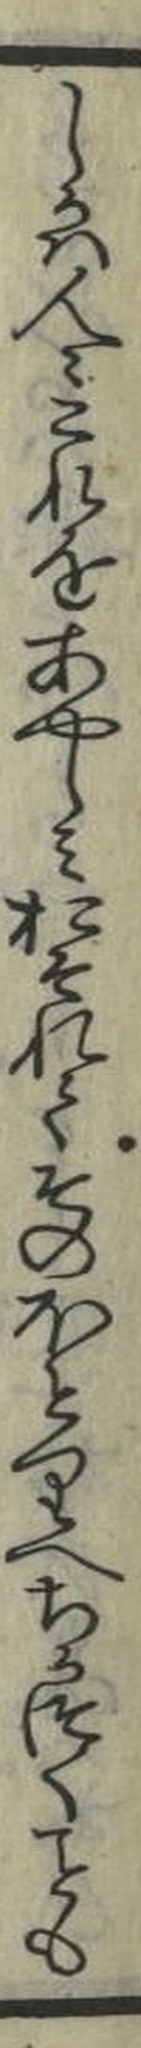しかは人々これをあやしみおそれて・そのほとりへちかつくことも
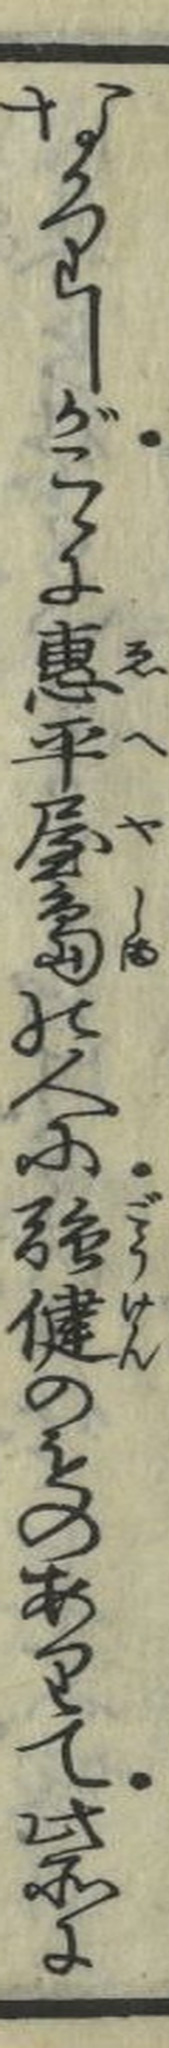なかりしが・こゝに惠平屋島の人に・強健のものありて・此所に
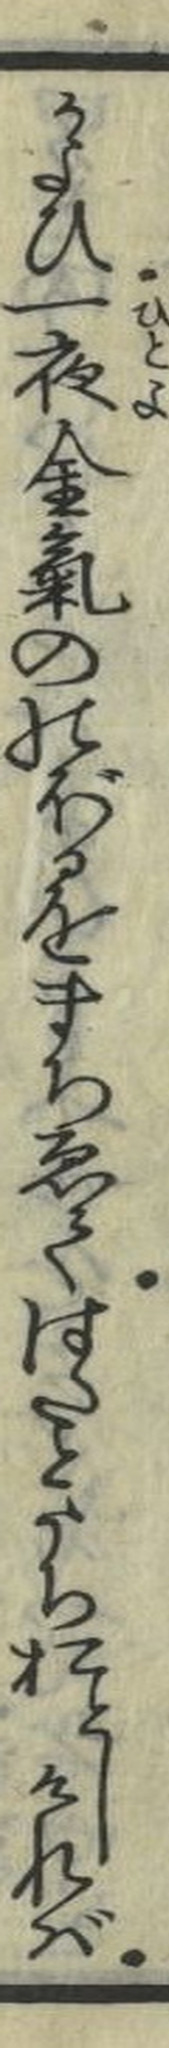かよひ・一夜金氣ののぼるをまちゑて・はたとうちおとしければ・
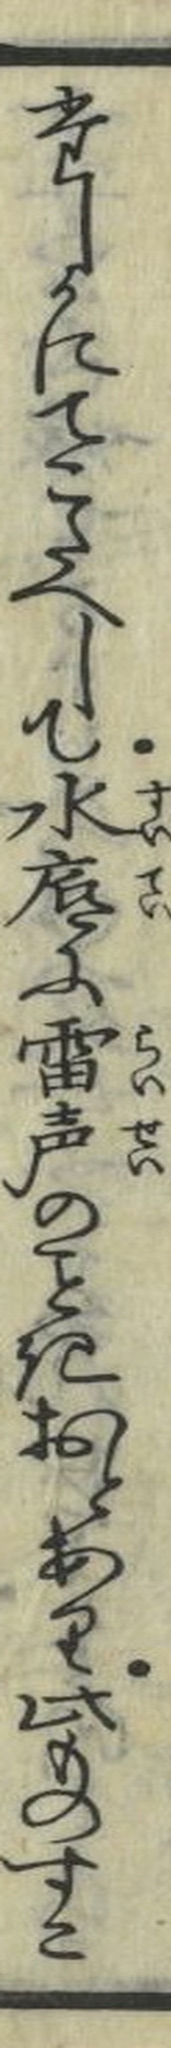たしかにてこたへして・水底(すいてい)に雷声のこときおとあり・此ものすこ
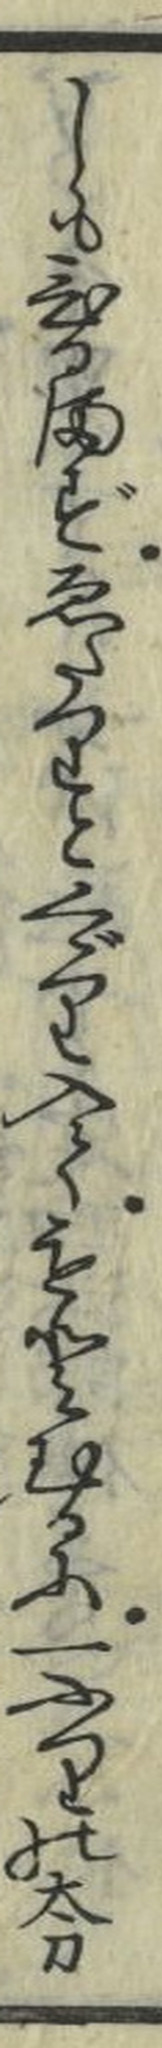しもひるまず・ゑたりとくゞり入て・もとむるに・一ふりの太刀
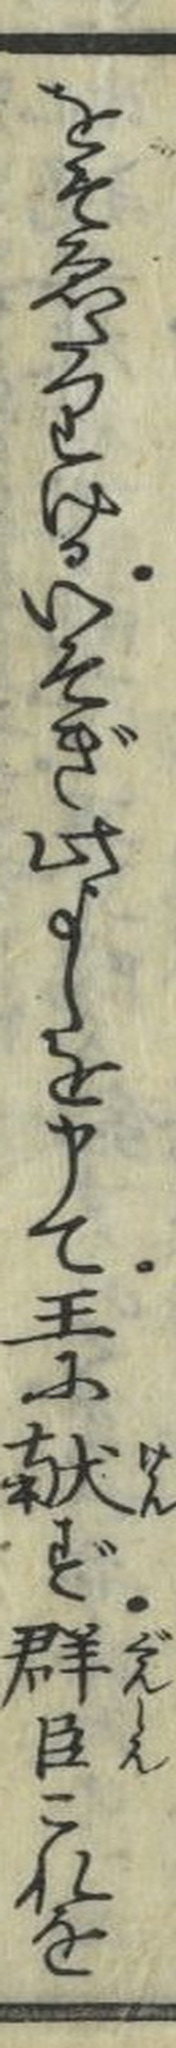をそゑたりける・いそぎ此よしを申て・王に献ず・群臣これを
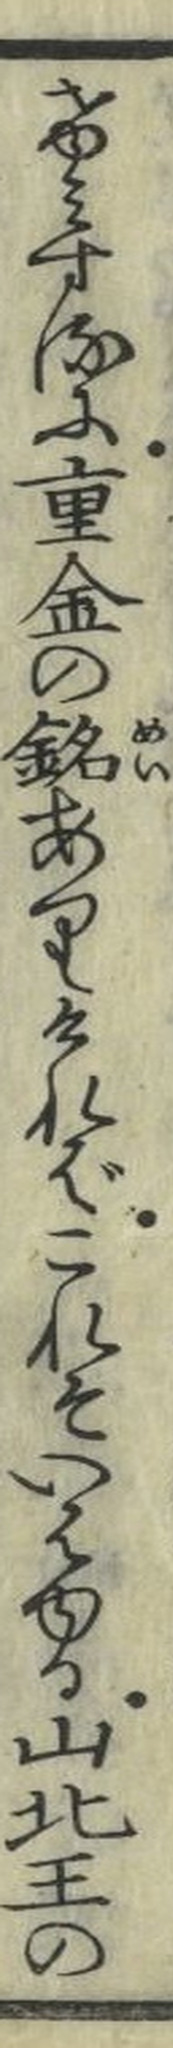けみするに・重金の銘ありければ・これそいはゆる・山北王の
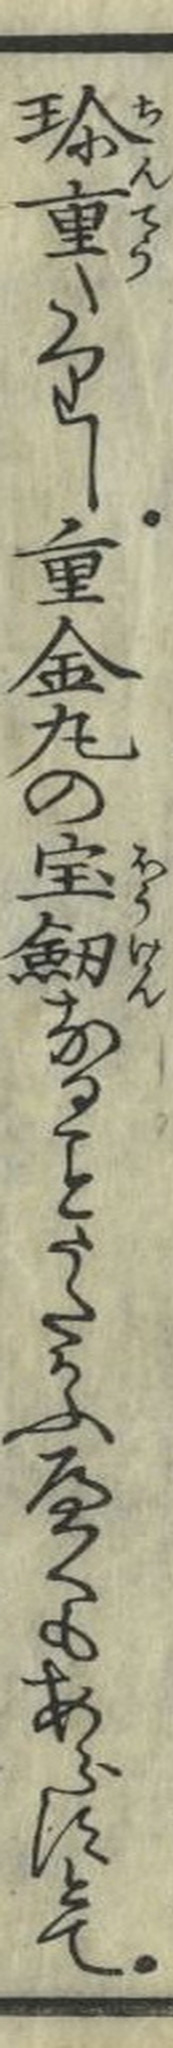珍重たりし・重金丸の宝劔なることうたかふへくもあらすとて・
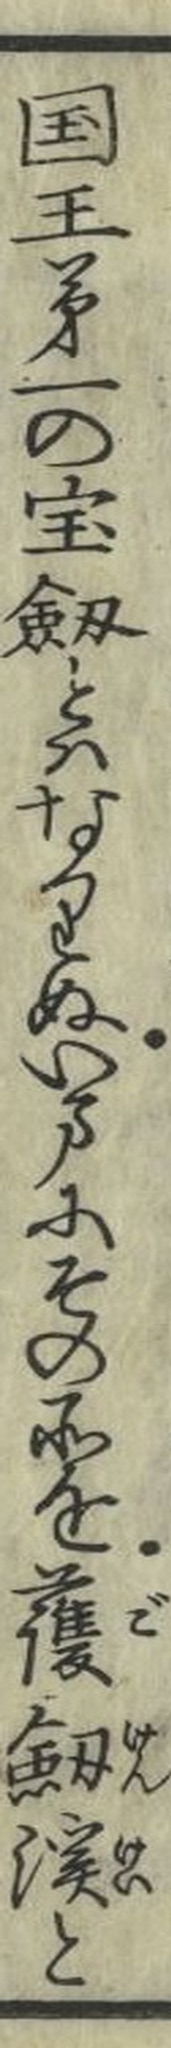国王第|の宝劔とはなりぬ・いまにその所を・護劔渓と
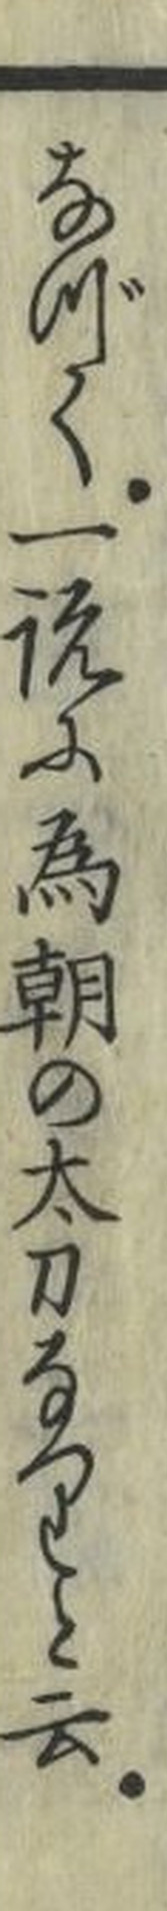なづく・一説に爲朝の太刀なりと云・
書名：琉球秊代記 附雑話 全
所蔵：University of the Ryukyus Library
